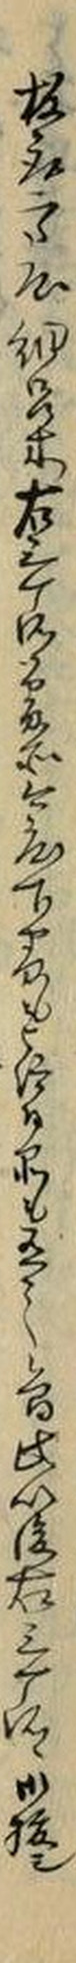板取二ツ屋細呂木右三ケ所御番所今度下番も被仰付品も有之候間此以後右三ケ所へ御シ
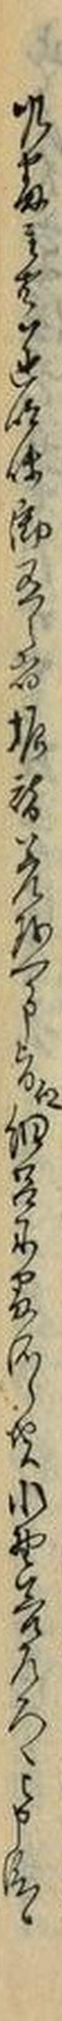順番ニ候共遂吟味働有之者振替差越可申旨但細呂木番所之儀ハ水野善左衛門へ被申渡候
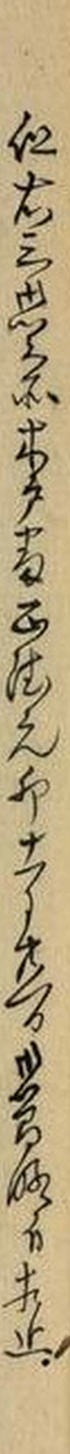但右三御関所木戸番正徳元卯十一月廿一日御簡略ニ付相止
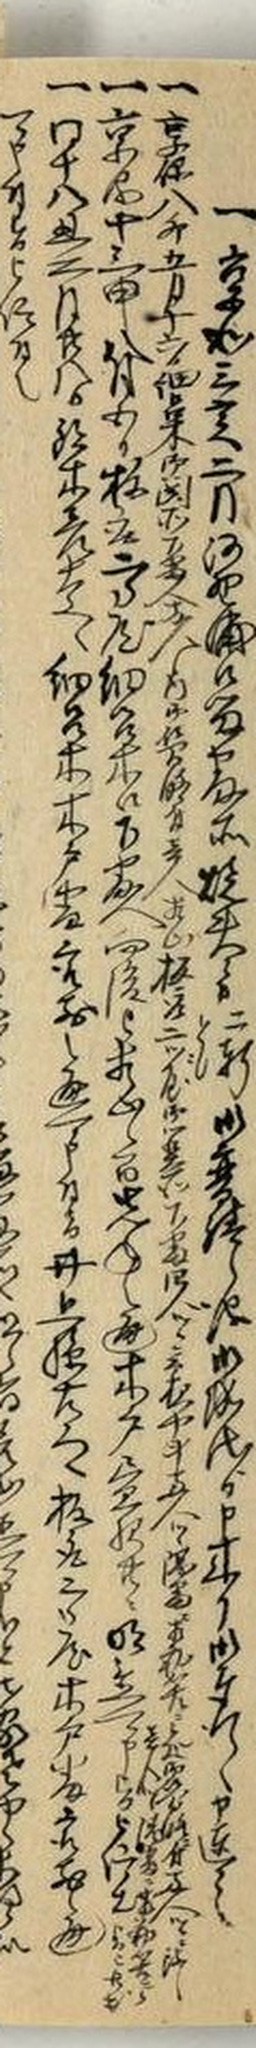一享保十三申八月五日板取二ツ屋細呂木口下番人向後被相止候間先年之通木戸昼夜共ニ明置可申旨被仰出
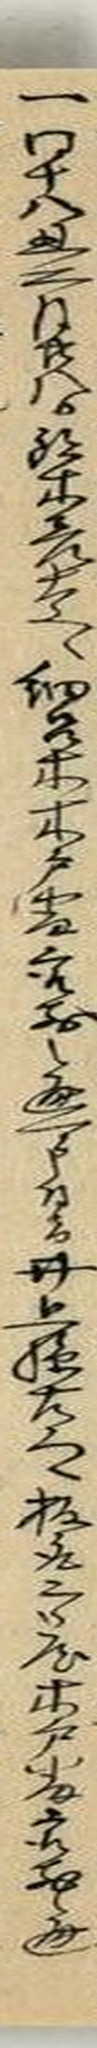一同十八丑二月廿八日鈴木彦太夫へ細呂木木戸番最前之通可申旨井上孫左衛門へ板取二ツ屋木戸番最前之通
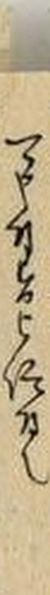可申付旨被仰付候
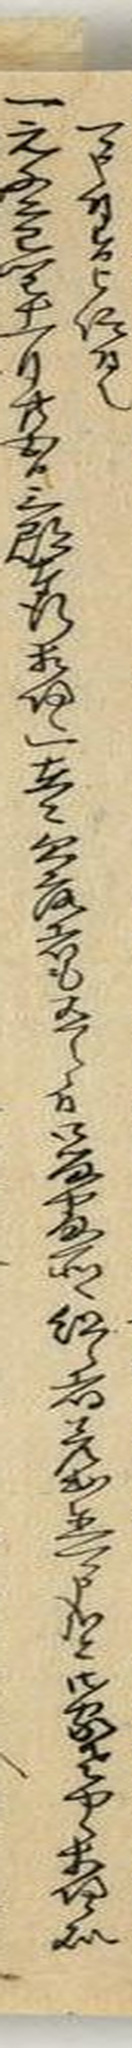一元文二巳閏十一月廿五日三郡奉行相伺候一在々欠落者も有之ニ付口留番所へ組之者差出置可申哉と御家老中へ相伺候処
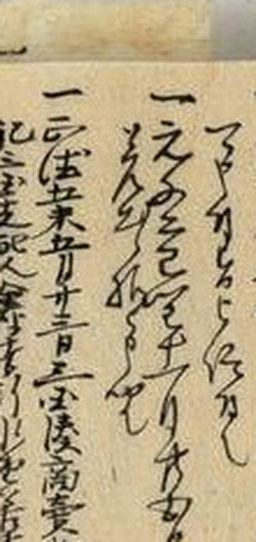差出候様被申聞候
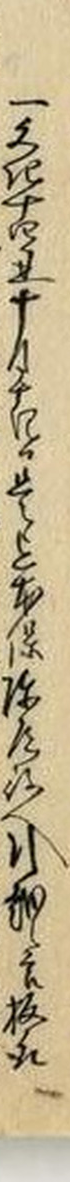一文化十四丑十月十四日是迄本保陣屋役人引越候節板取
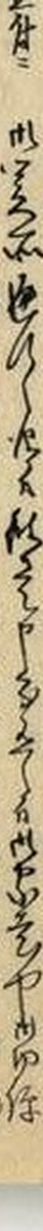御関所通行之儀ニ付彼是申分有之ニ付御家老中御内許
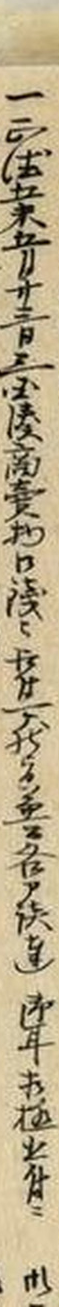一正徳五未五月廿三日三国湊商売物口銭被仰付可然旨兼而各申談達御耳相極書付ニ
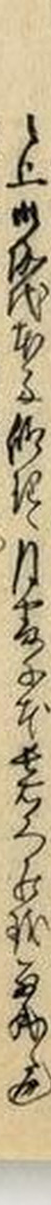之上御城代本多修理へ月番千本長右衛門罷越別紙之通
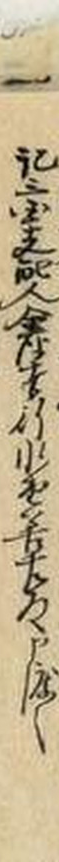記三国支配人金津奉行水野善左衛門へ申渡之
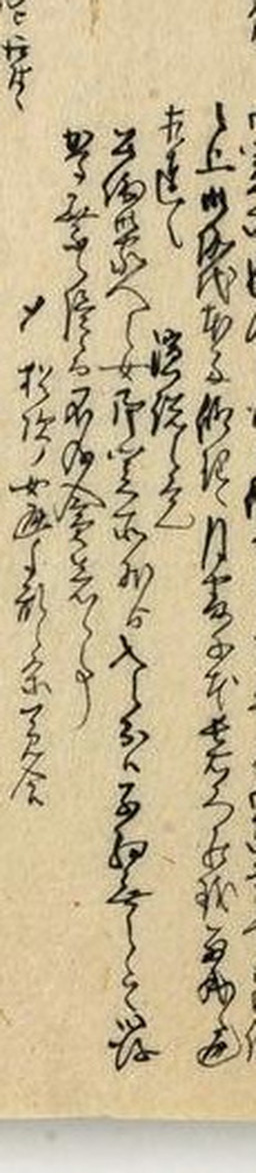公儀御家人之女御関所外ゟ入之分ハ子細無之候ハヽ以後
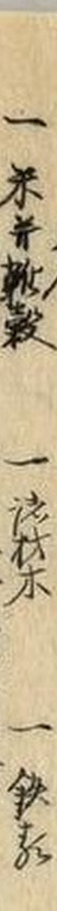一米幷雑穀一諸材木一鉄類
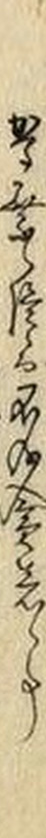駕乗候儘ニ而不成貪着候事
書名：御国他国諸事之部
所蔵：福井県文書館 Fukui Prefectural Archives
